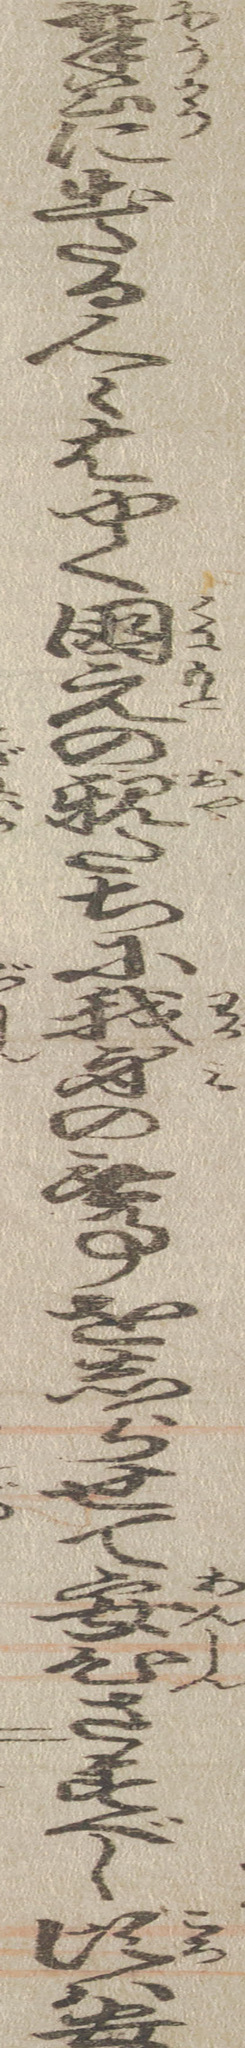奉公に出たる人〻はやく国元の親たちに我身の無事をしらせて安心さすべし頃ハ安政
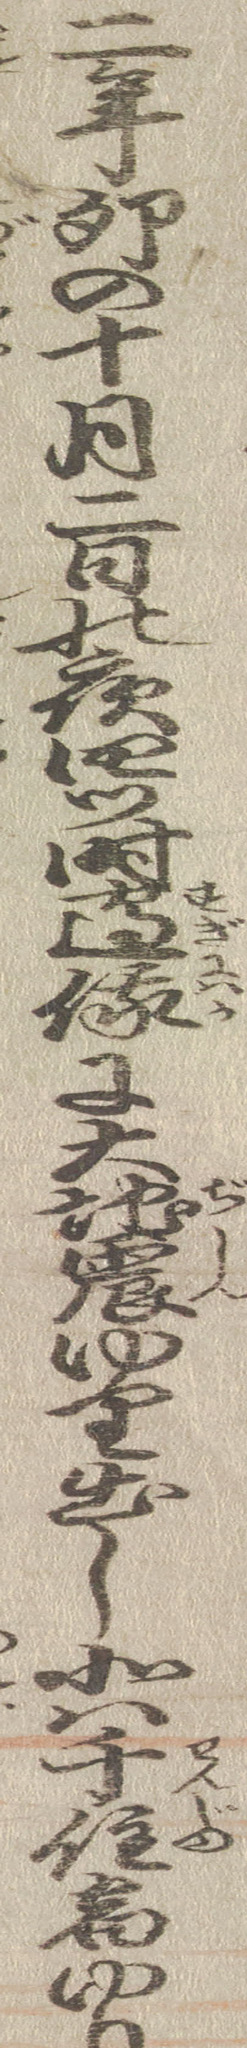二年夘の十月二日の夜四ツ時過俄に大地震ゆり出し北は千住宿ゆり
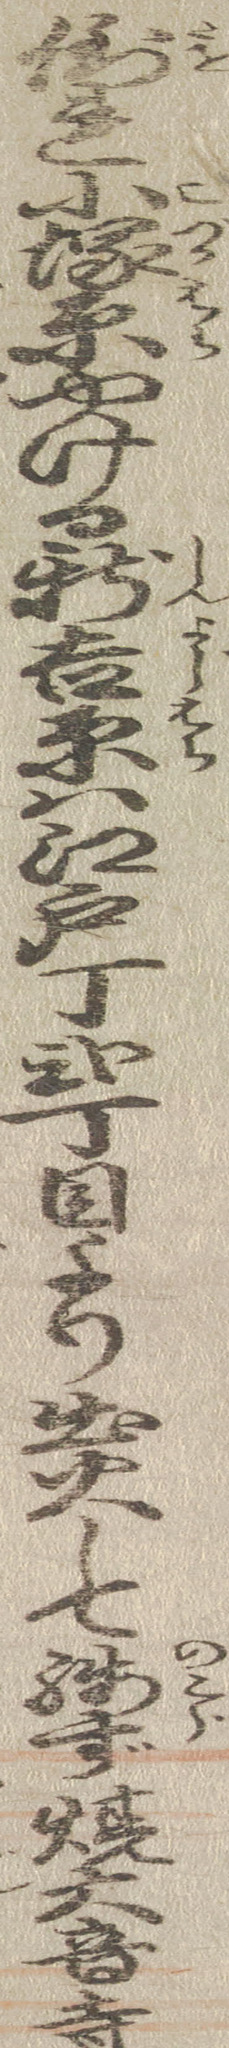倒れ小塚原やける新吉原ハ江戸丁弐丁目より出火して残ず焼大音寺
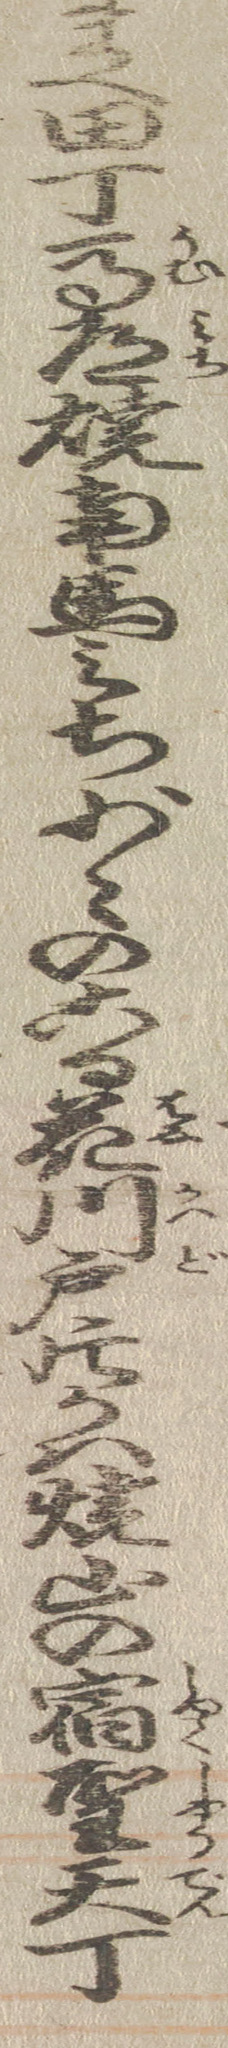まへ田丁馬道焼南馬ミち少〻のこる花川戸片かハ焼山の宿聖天丁
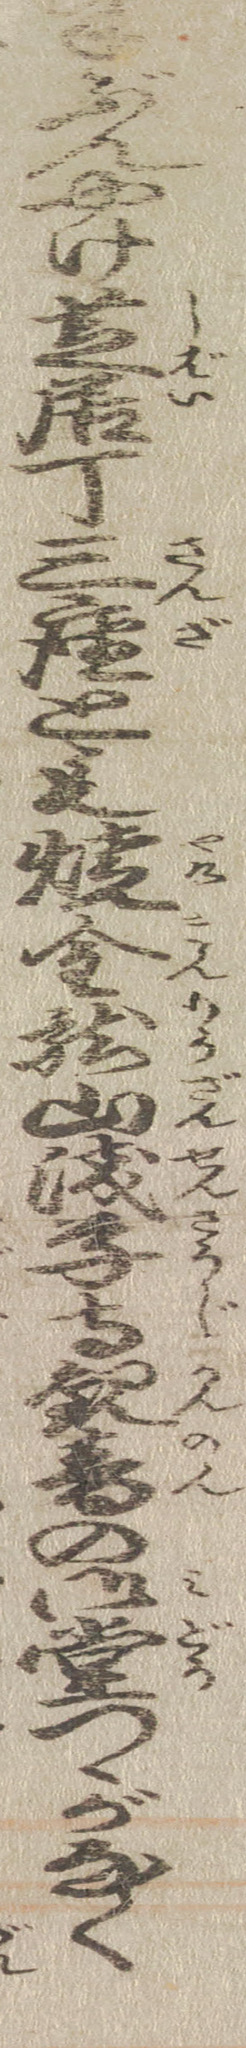半ぶんやけ芝居丁三座とも焼金龍山淺草寺観音の御堂つゝがなく
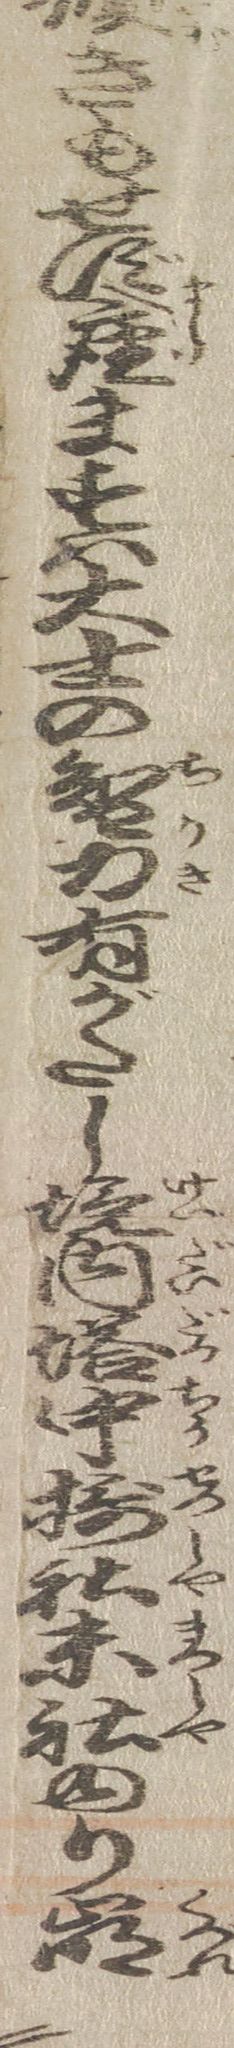傾きもせず座ますハ大士の智力有がたし境内塔中摂社末社ゆり崩
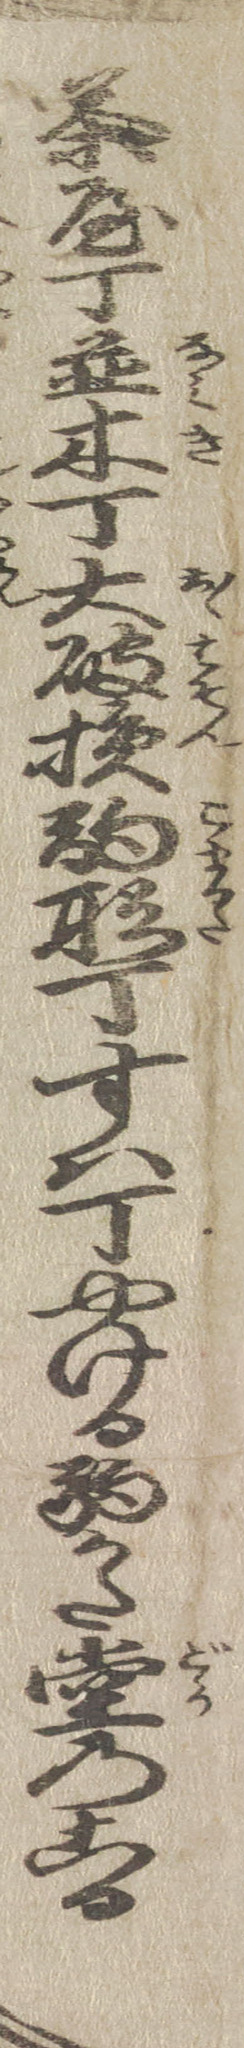茶屋丁並木丁大破損駒形丁すハ丁やける駒かた堂乃のこる
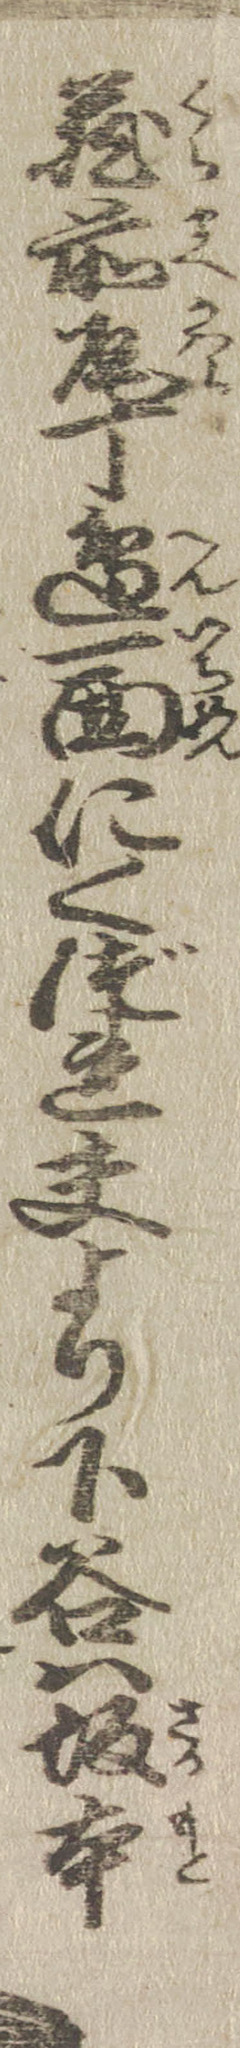蔵前瓦丁邊一面にくずれ夫より下谷ハ坂本
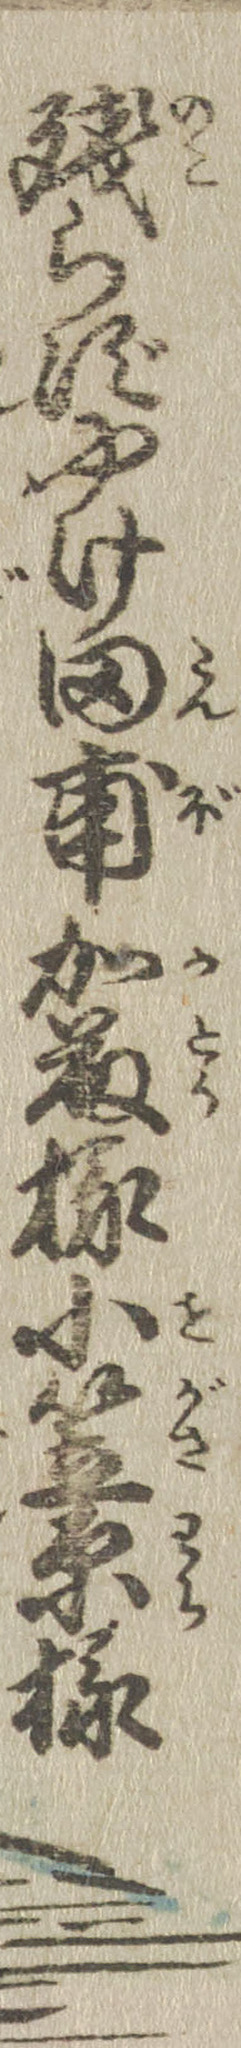残らずやけ田甫加藤様小笠原様
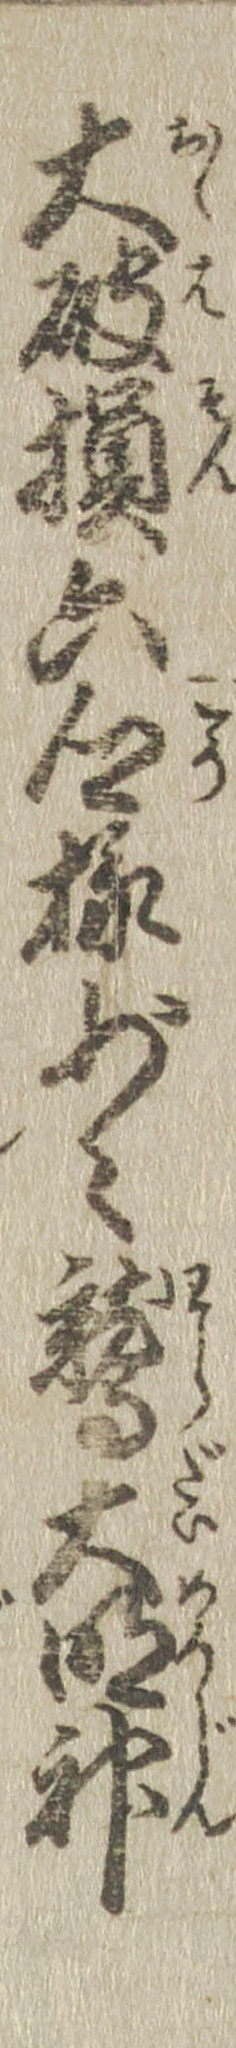大破損六郷様少〻鷲大明神
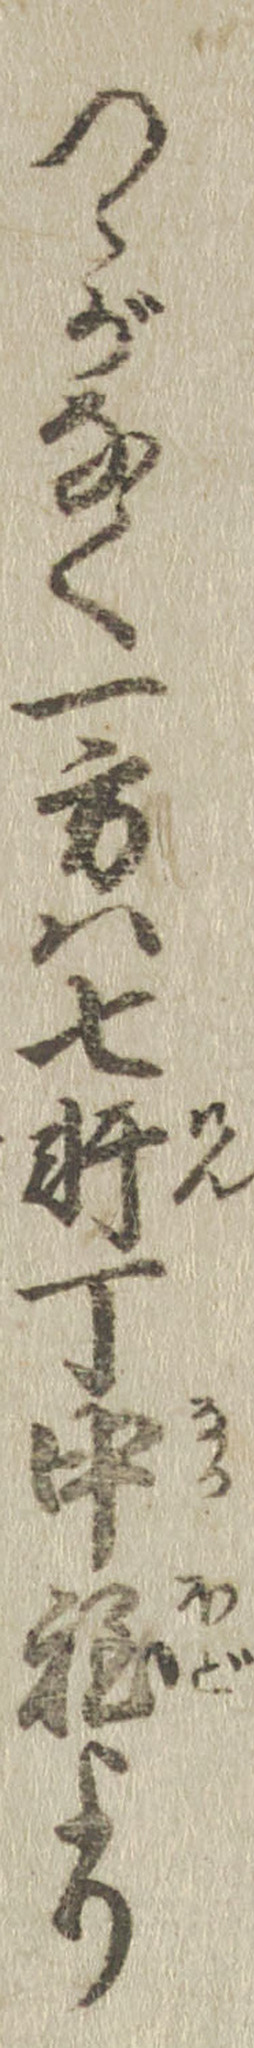つゝがなく一方ハ七軒丁中程より
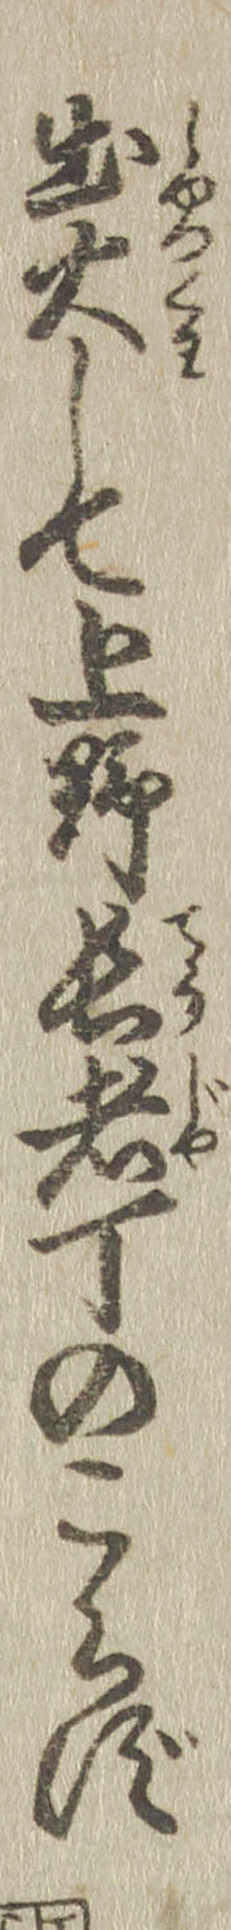出火して上野長者丁のこらず
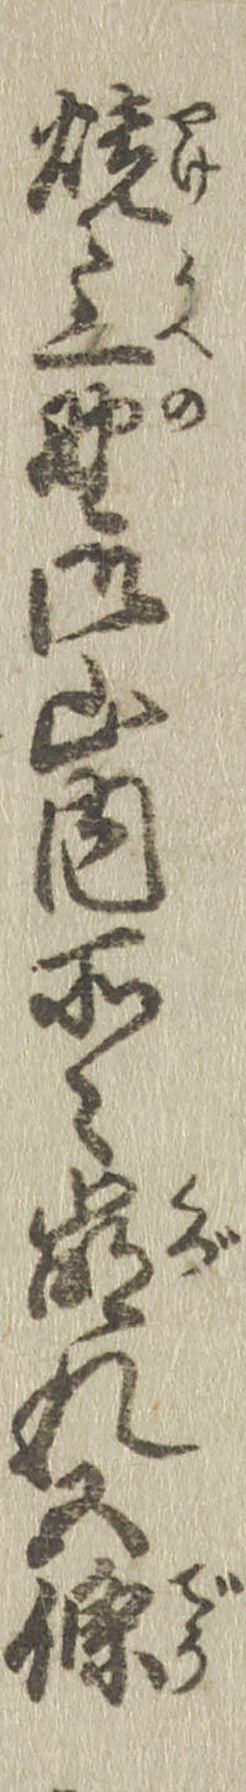焼上野御山内所〻崩れ五條
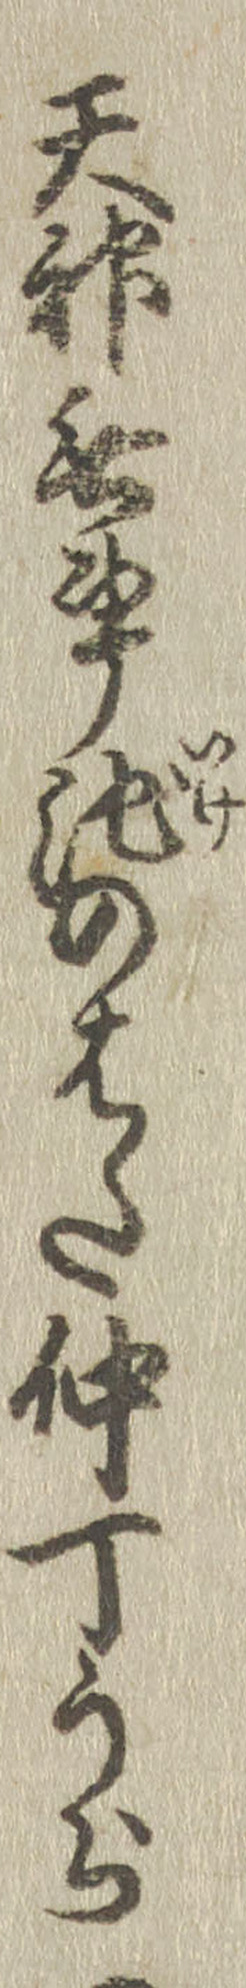天神無事池のはた仲丁うら
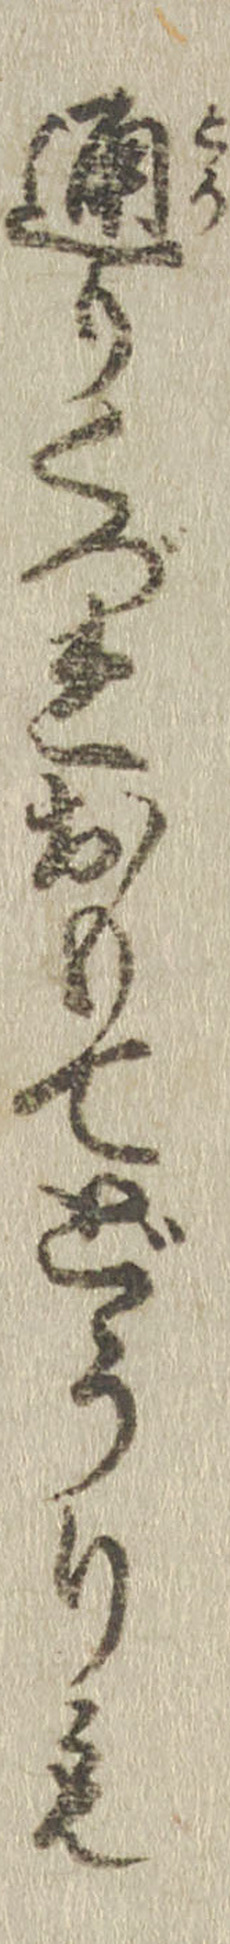通りくづれおもてどうりも
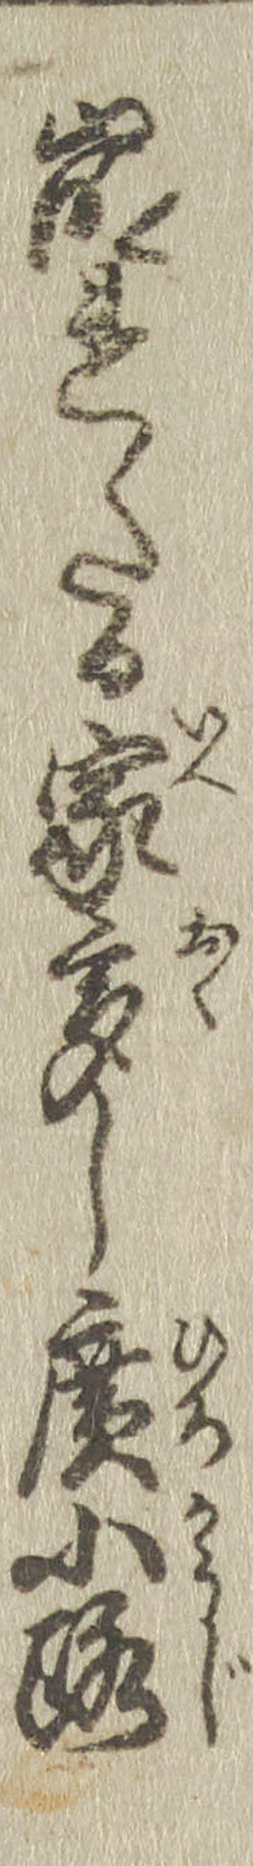崩れたる家多し廣小路
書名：ゆるがぬ御代要之石寿栄
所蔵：東京大学総合図書館 General Library in the University of Tokyo, JAPAN
